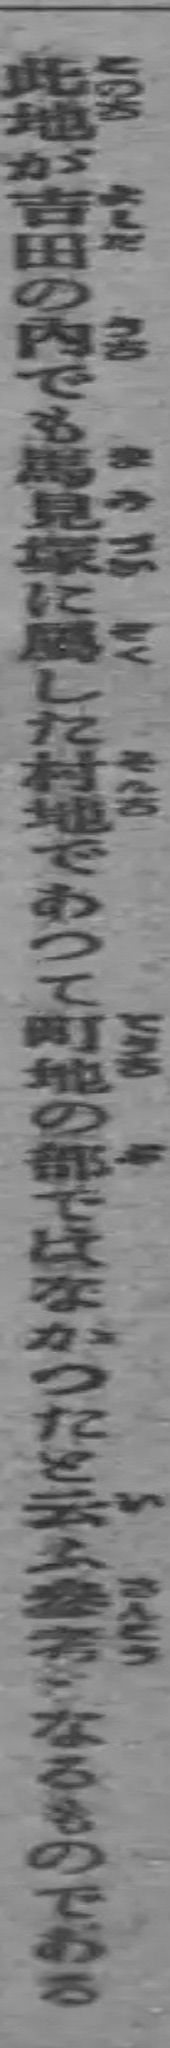此地が吉田の内でも馬見塚に属した村地であつて町地の部ではなかつたと云ふ参考となるものである
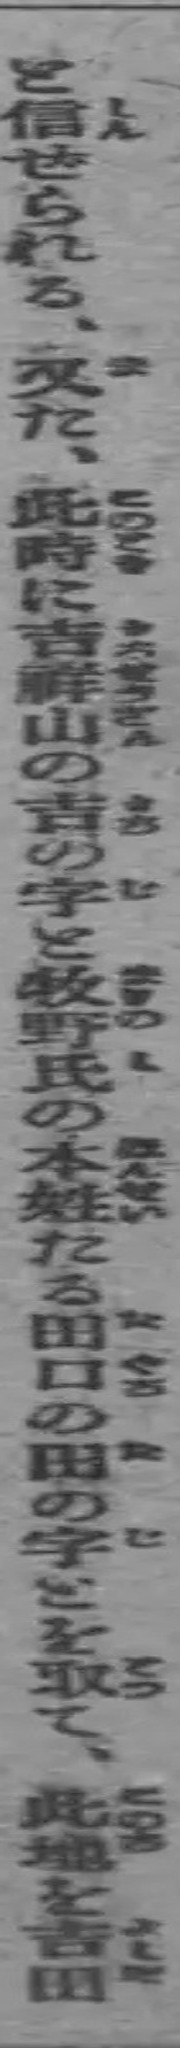と信ぜられる、又た、此時に吉祥山の吉の字と牧野氏の本姓たる田口の田の字とを取て、此地を吉田
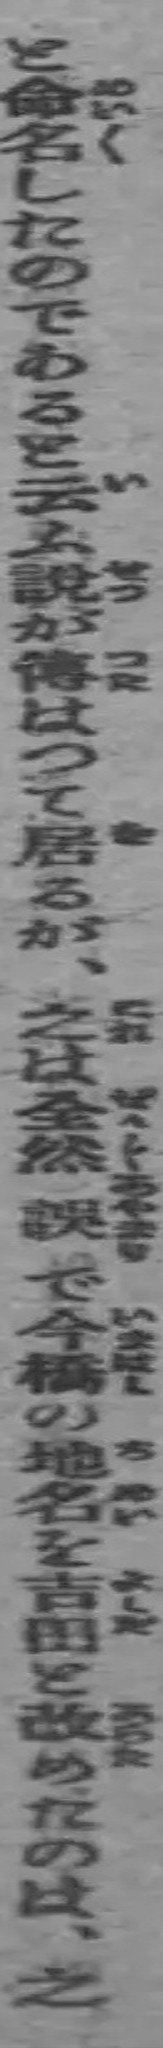と命名したのであると云ふ説が伝はつて居るが、之は全然誤で今橋の地名を吉田と改めたのは、之
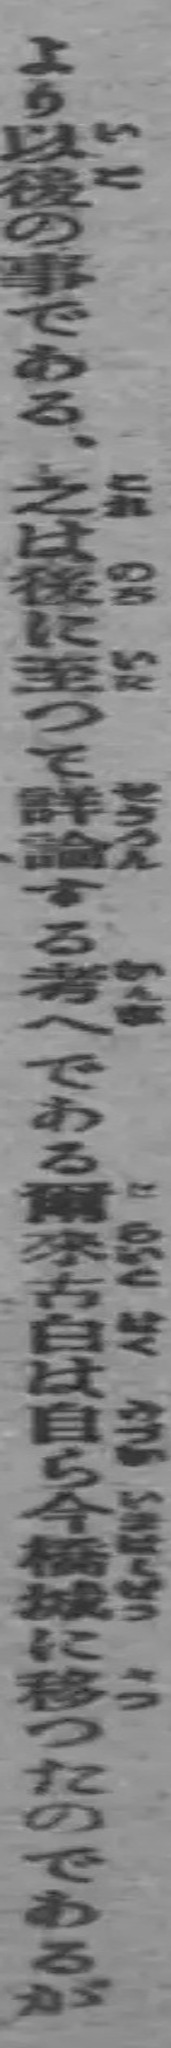より以後の事である、之は後に至つて詳論する考へである爾来古白は自ら今橋城に移つたのであるが
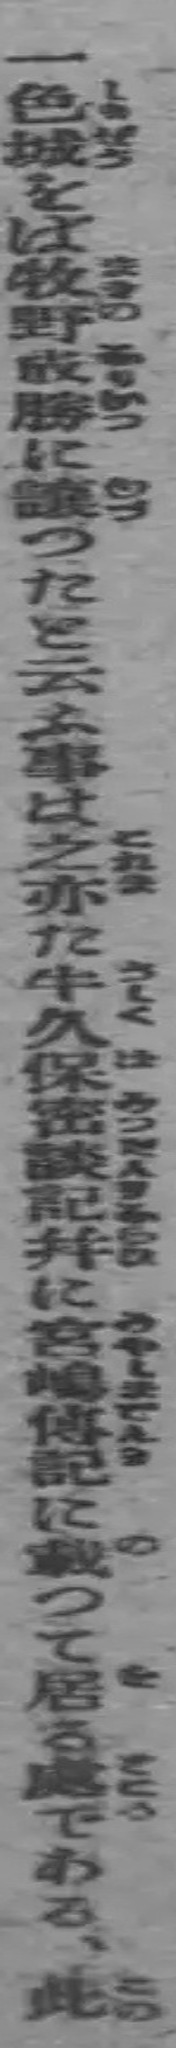牧野成勝一色城をば牧野成勝に譲つたと云ふ事は之亦た牛久保密談幷にみ宮嶋伝記に載つて居る処である、此
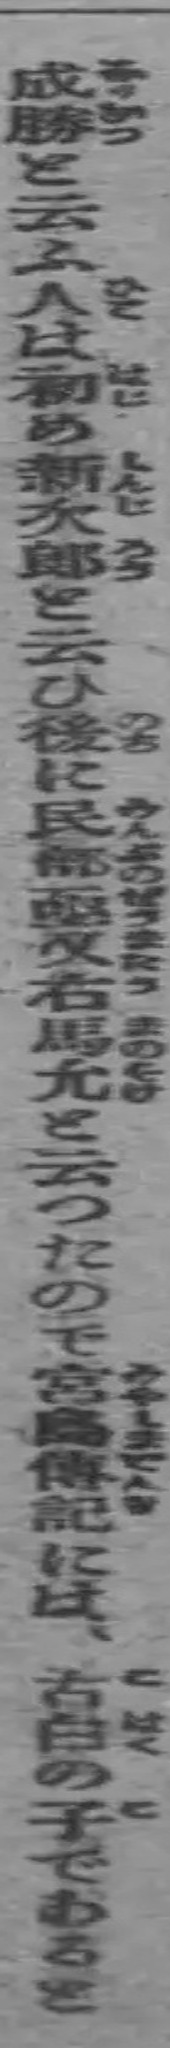成勝と云ふ人は初め新次郎と云ひ後に民部丞又右馬允と云つたので宮島伝記には、古白の子であると
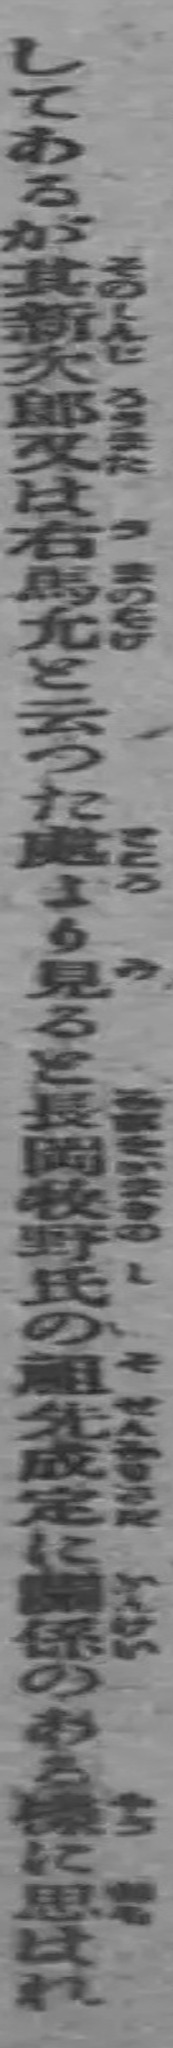してあるが其新次郎又は右馬允と云つた処より見ると長岡牧野氏の祖先成定に関係のある様に思はれ
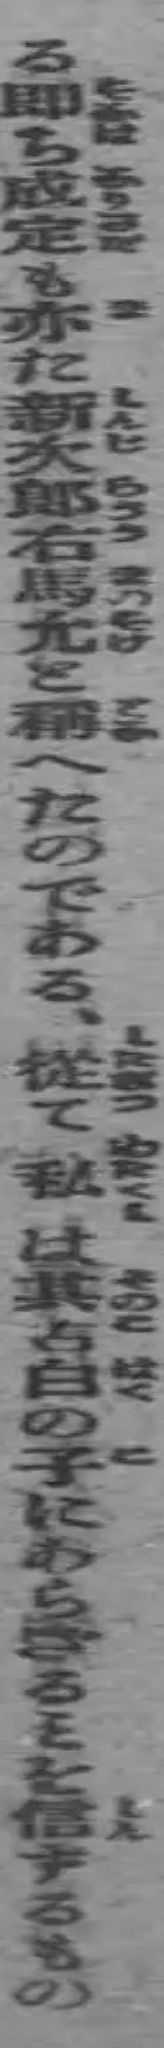る即ち成定も亦た新次郎右馬允と称へたのである、従て私は其古白の子にあらざることを信ずるもの
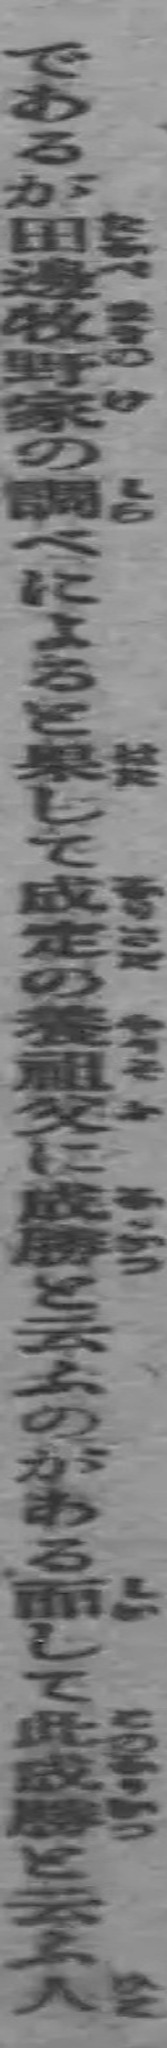であるが田辺牧野家の調べによると果して成定の養祖父に成勝と云ふのがある而して此成勝と云ふ人
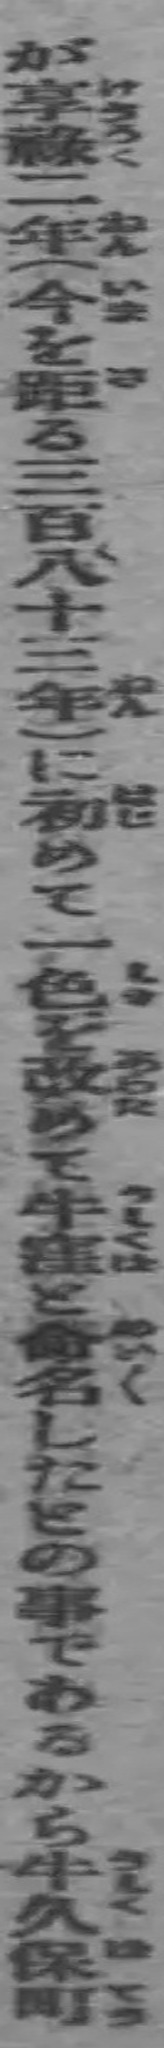が享禄二年(今を距る三百八十三年)に初めて一色を改めて牛窪と命名したとの事であるから牛久保町
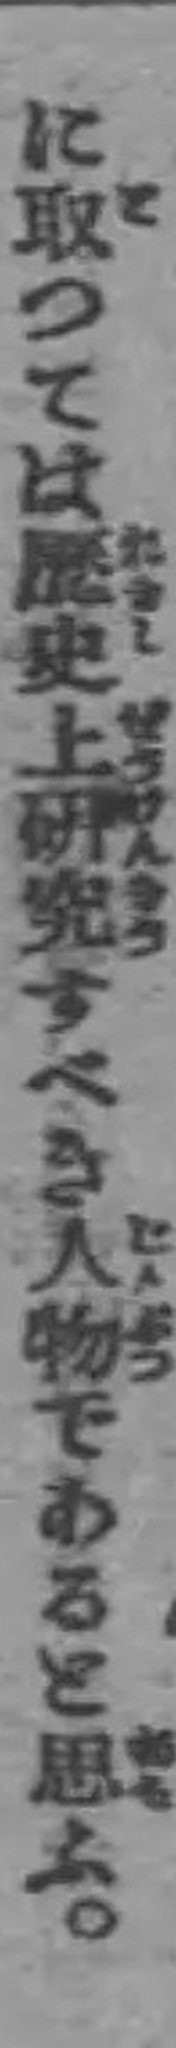に取つては歴史上研究すべき人物であると思ふ。
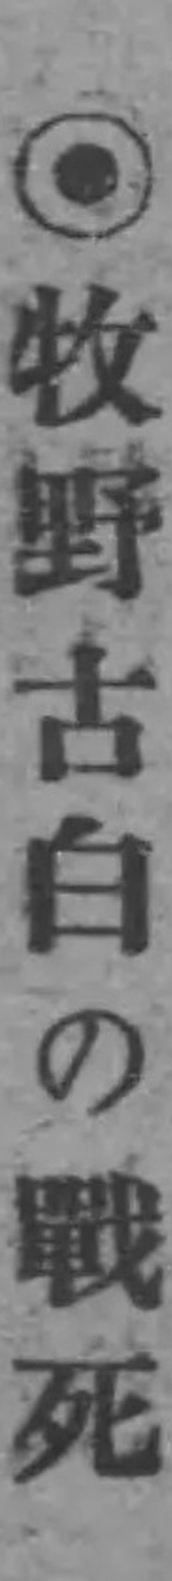⦿牧野古白の戦死
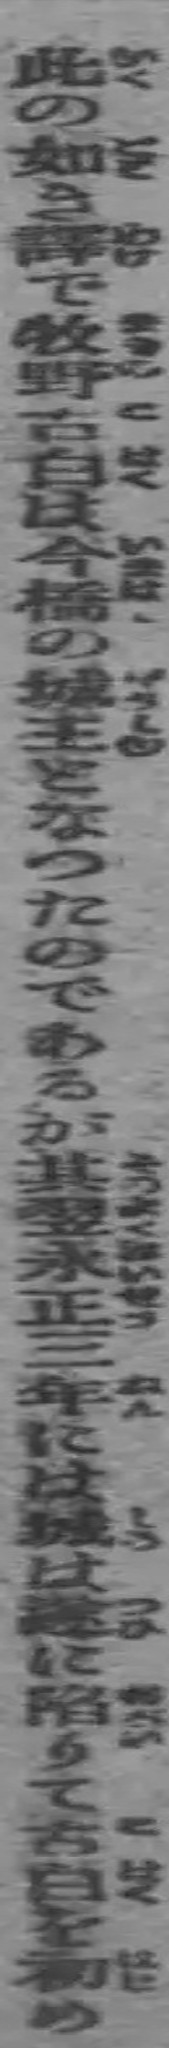此の如き訳で牧野古白は今橋の城主となつたのであるが其翌永正三年には城は遂に陥りて古白を初め
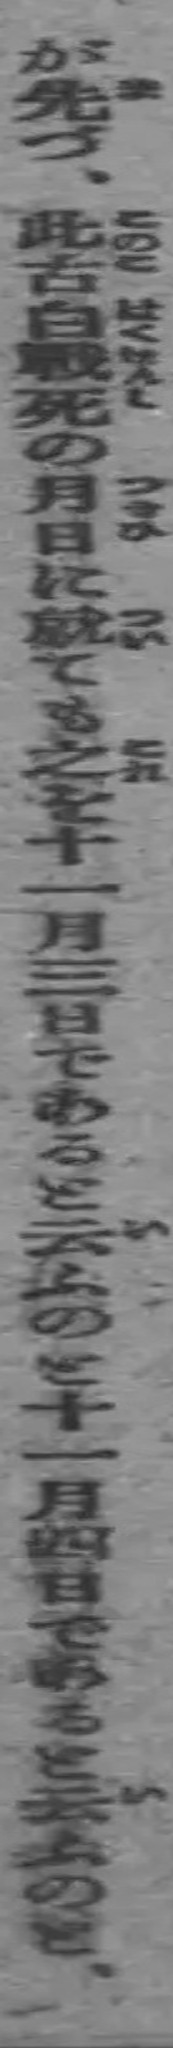が先づ、此古白戦死の月日に就ても之を十一月三日であると云ふのと十一月四日であると云ふのと、
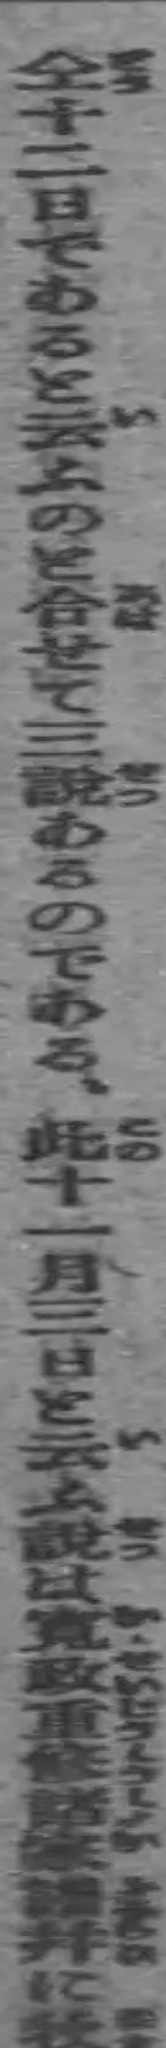仝十二日であると云ふのと合せて三説あるのである、此十一月三日と云ふ説は寛政重修諸家譜幷に牧
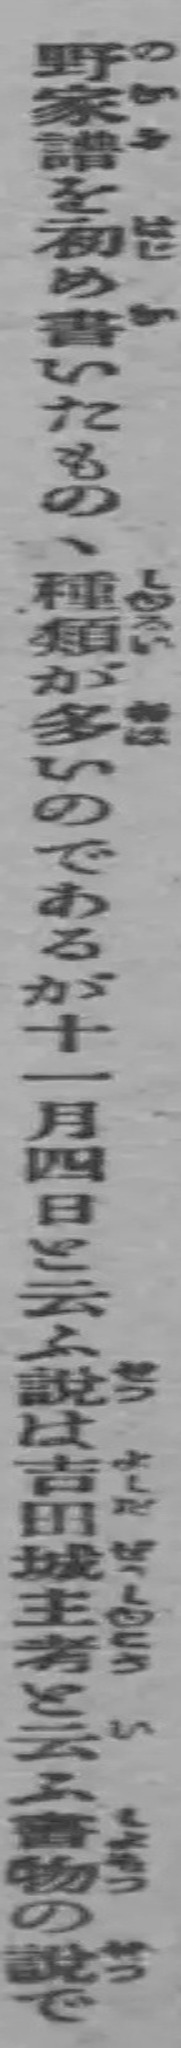吉田城主考野家譜を初め書いたものゝ種類が多いのであるが十一月四日と云ふ説は吉田城主考と云ふ書物の説で
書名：豊橋市史談
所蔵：国立国会図書館 National Diet Library, JAPAN
